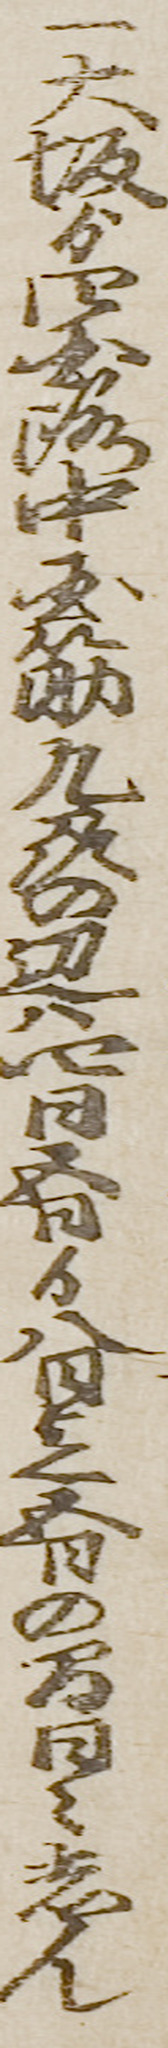一大坂より四国路中国筋九州の辺は四日五日より八日迄五日の間日々しん
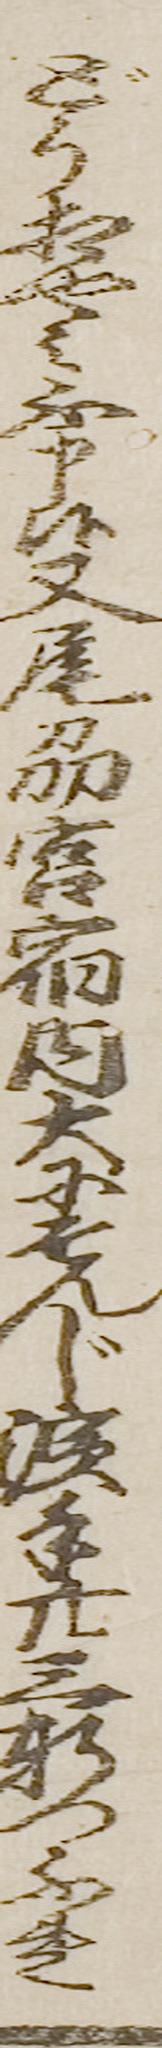どう相やみ不申候又尾州宮宿内大にそんじ浜手廿三軒つふれ
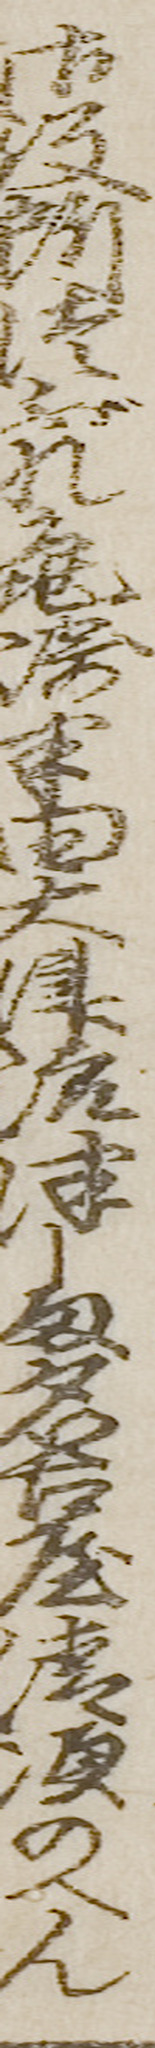御役所つぶれ亀崎半田大津浪つしま名古屋清須のへん
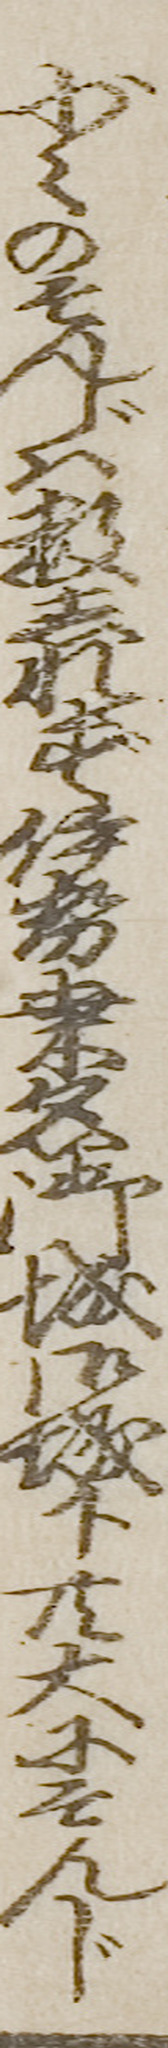少々のそんじは数しれず伊勢桑名御城御城下共大にそんじ
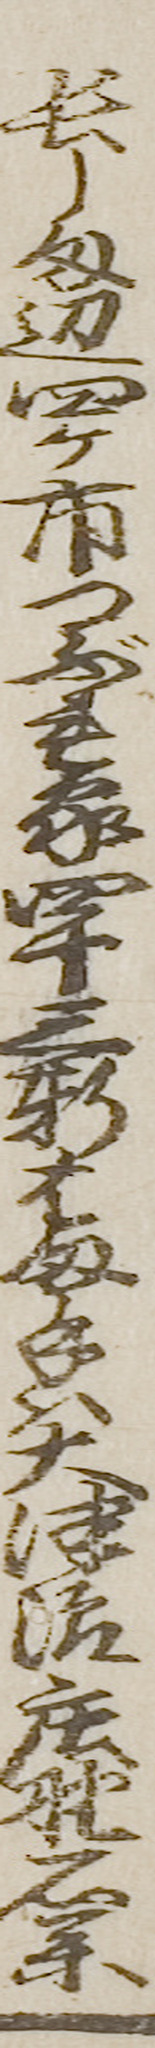長しま辺四ケ市つぶれ家四十三軒はま手は大津浪庄野石薬
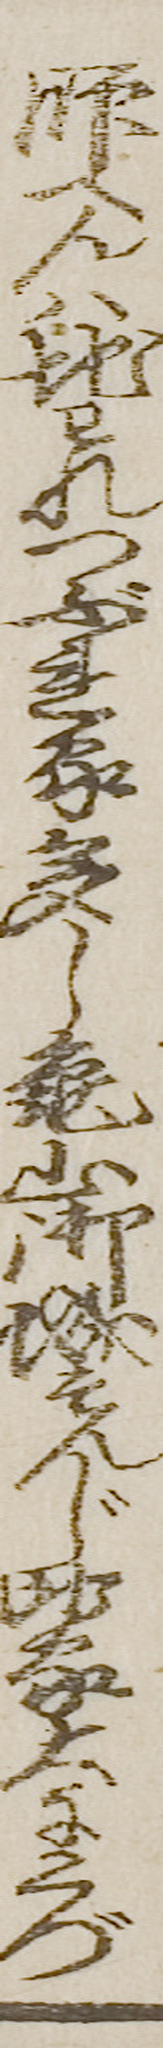師へんは地われつぶれ家多し亀山御城そんじ町家大にくづ
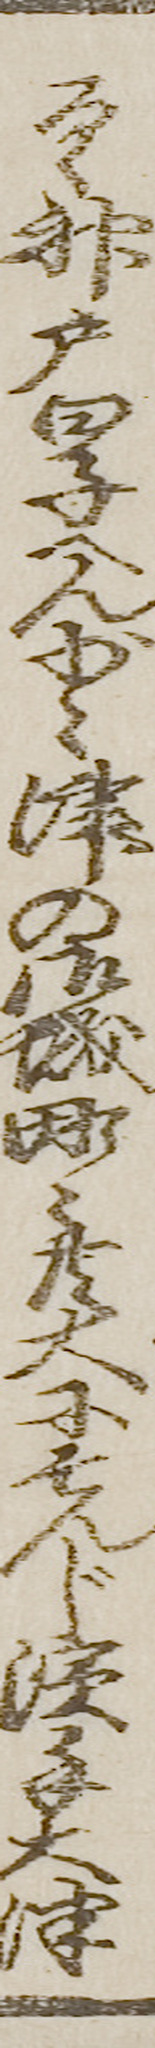るゝ神戸白子へん少々津の御城町々共大にそんじ浜手大津
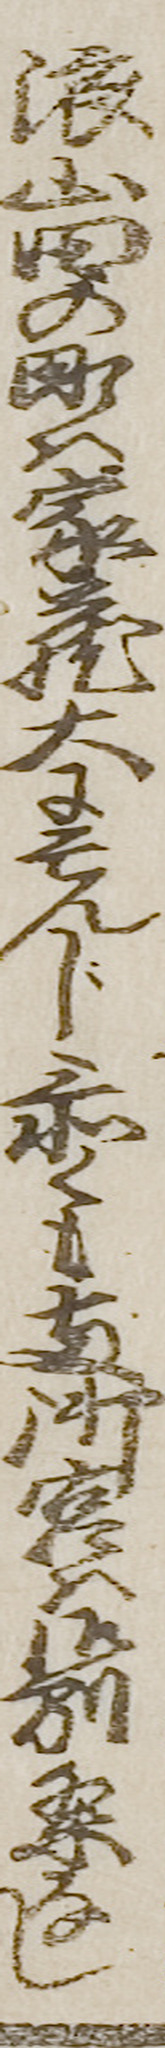浪山田の町は家蔵大にそんじ忝くも両御宮は御別条なし
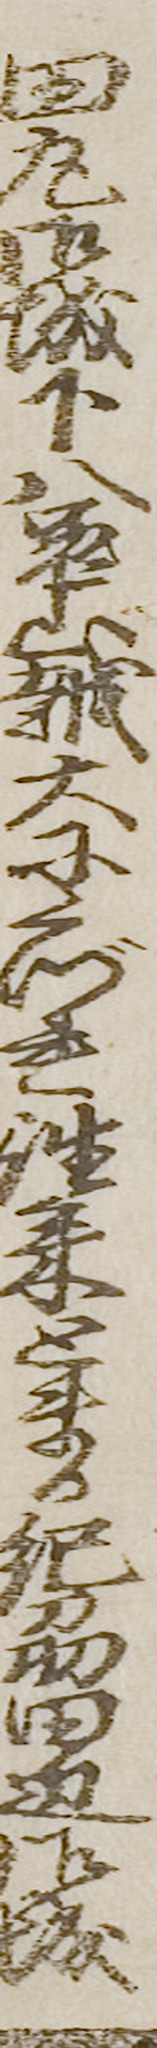田丸御城下八鬼山越大にくづれ往来とまる紀州田辺御城
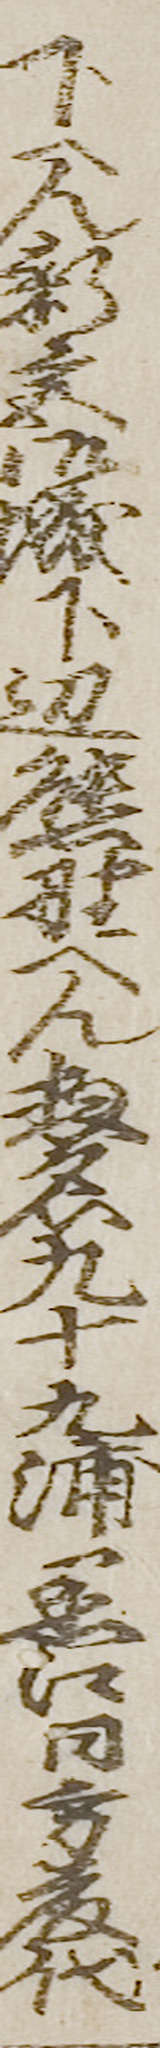下へん新宮御城下辺熊野へん惣名九十九浦黒江日方藤代
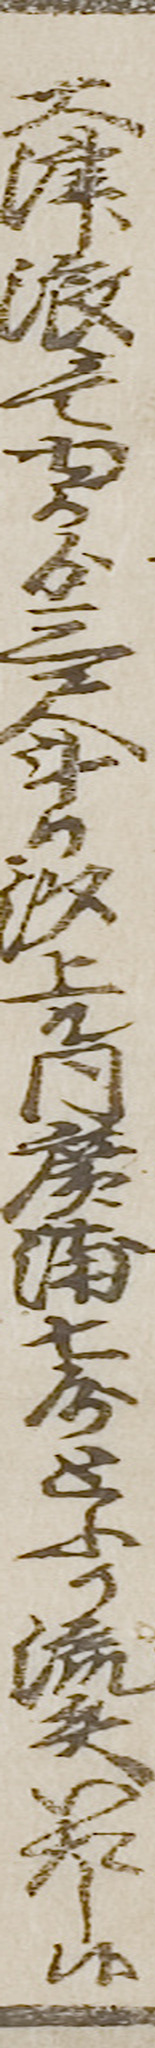大津浪にてゆかより三尺斗り汐上る同広浦七分とふり流失いたし候
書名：大地震大津浪場所書上之覚
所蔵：東京大学総合図書館 General Library in the University of Tokyo, JAPAN
